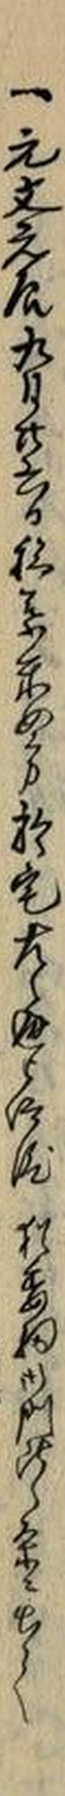一元文元辰九月廿六日稻葉采女方於宅左之通被仰渡猶委細御門断之条ニ出之
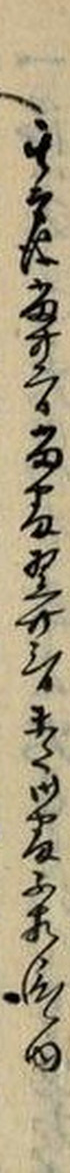其方儀当廿二日当番翌廿三日未た御番不相渡候内
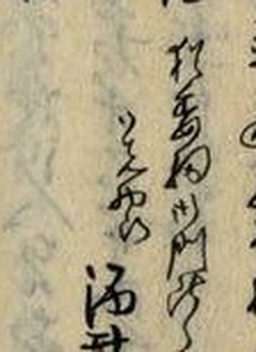御先物頭
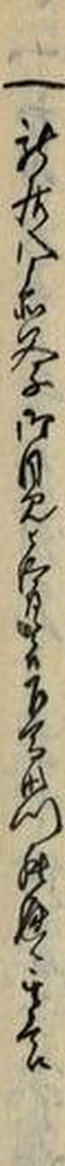新居八兵衛父子御目見被仰付候付下馬御門罷通其節
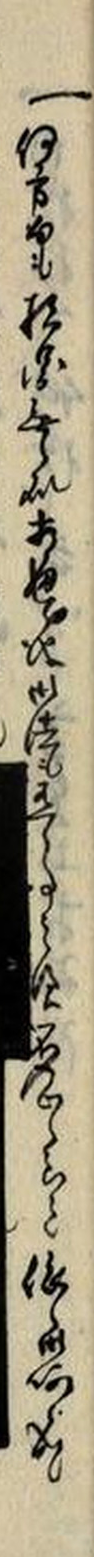何方ニ而も指図無之処相通候儀御法も有之事ニ候得ハ不念之至ニ候依之御呵被成候
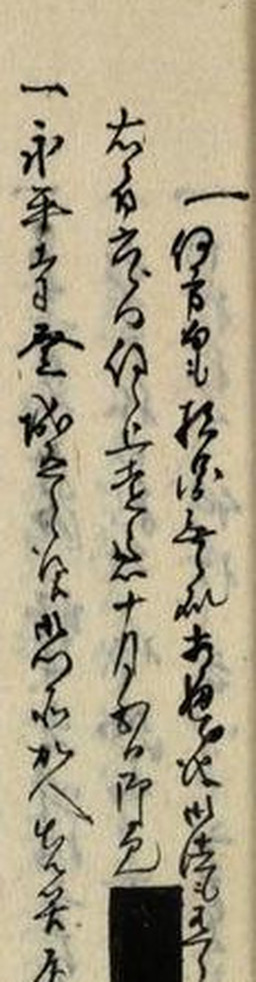右ニ付六郎右衛門伺之上遠慮十月五日御免
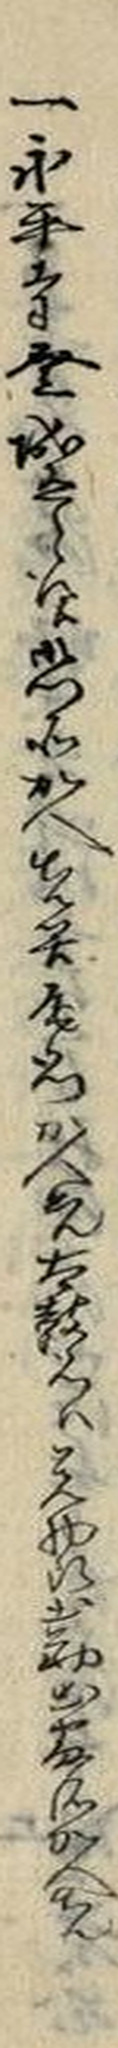一永平寺登城ニ候得ハ御門所加人出ル筈瓦御門加へ出ル太鼓御門ハ御先物頭出勤出番所加人出ル
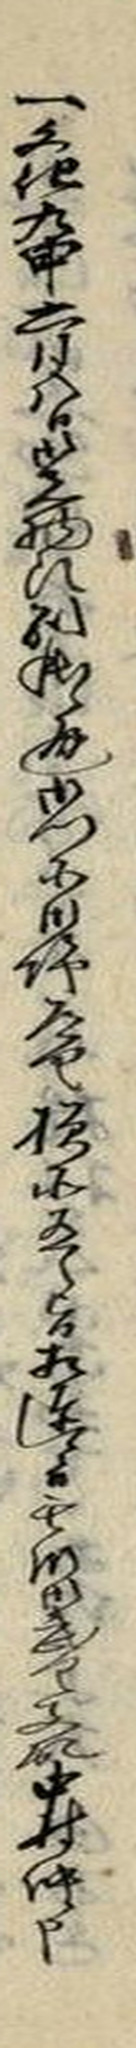一文化九申六月八日御先物頭別紙之通御門所御締道具損所有之旨相達候ニ付其段御武具支配中村仲へ申
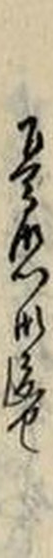下馬御門御道具
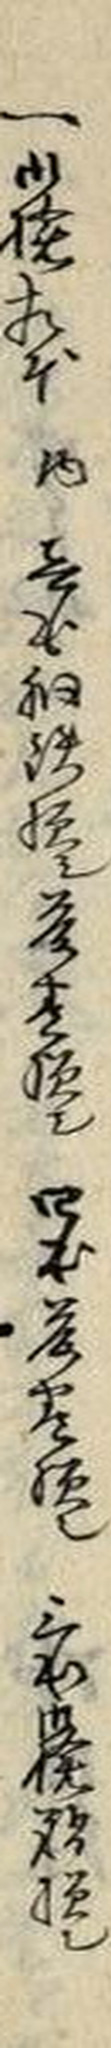一御槍拾本内壱本胴鉄損シ藤巻損シ四本藤巻損シ三本御槍鞘損シ
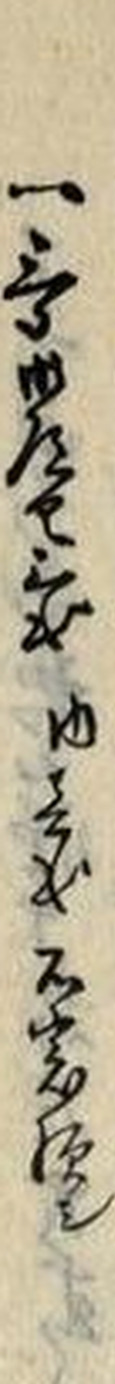一三ツ御道具三本内壱本石突損シ
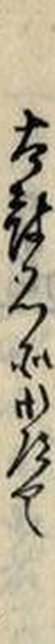太鼓御門処御道具
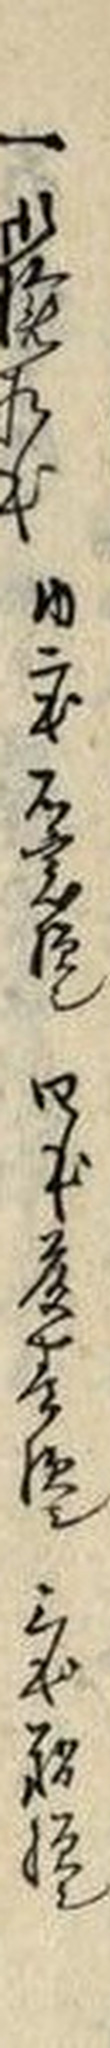一御槍拾本内二本石突損シ四本藤巻損シ三本鞘損シ
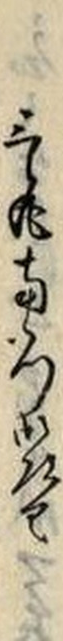三之丸南御門御道具
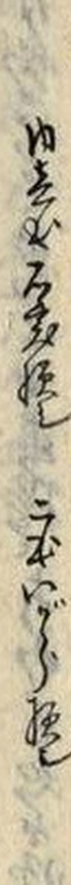一内壱本石突損シ二本いがら損シ
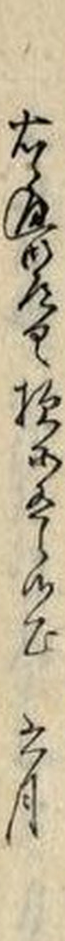右之通御道具損所有之候以上六月
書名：御門御櫓之部
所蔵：福井県文書館 Fukui Prefectural Archives
